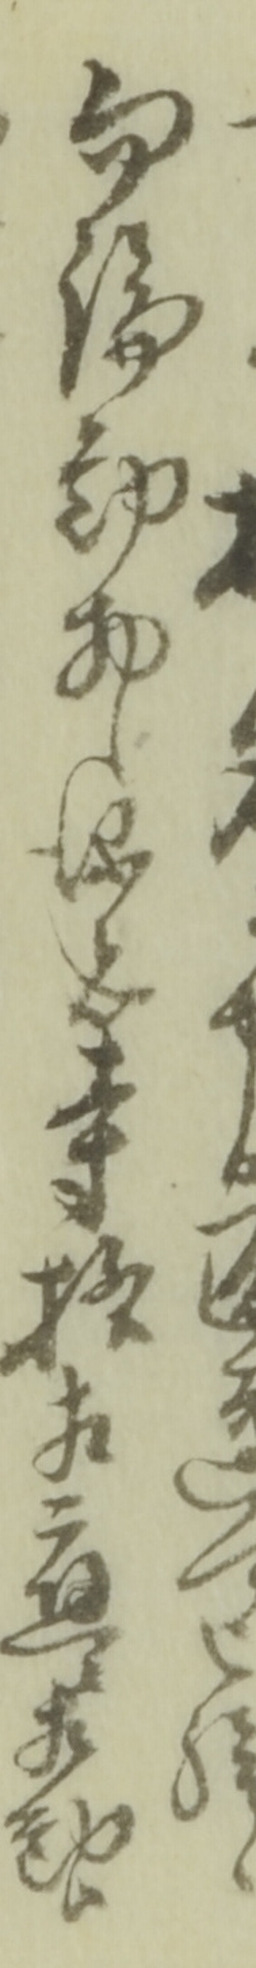向後勧物候儀者寺格相応じ相勧候
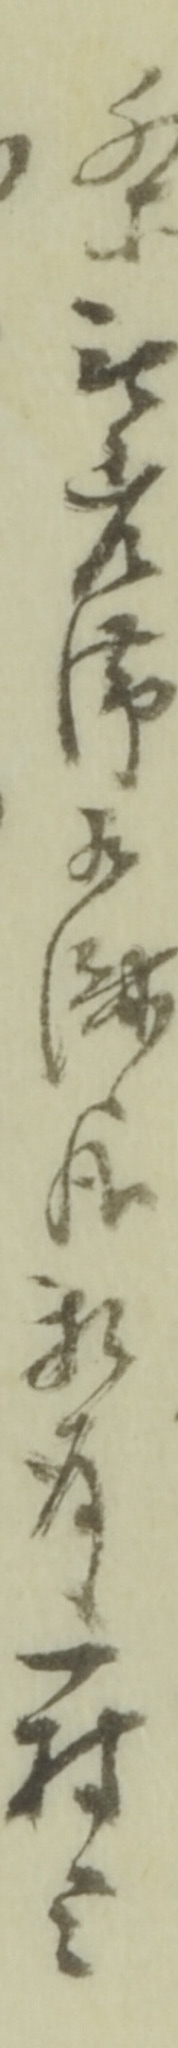条無差滞相済候様願存候一村迄
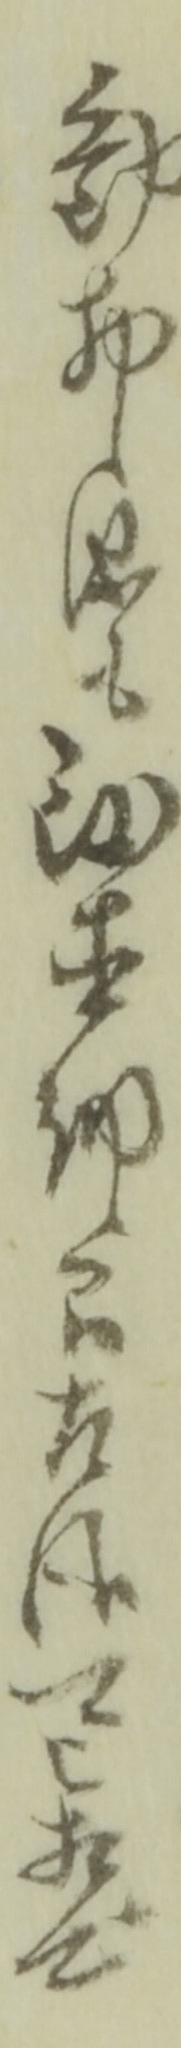勧物候儀も致直納候間左様可被相心
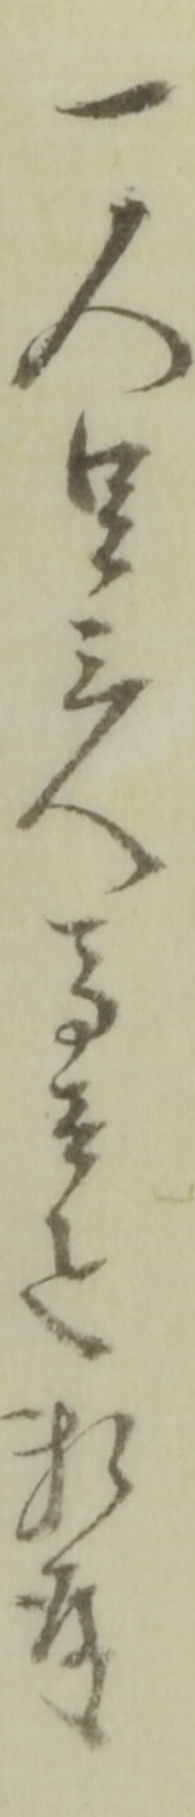一人足三人馬壱疋頼存候
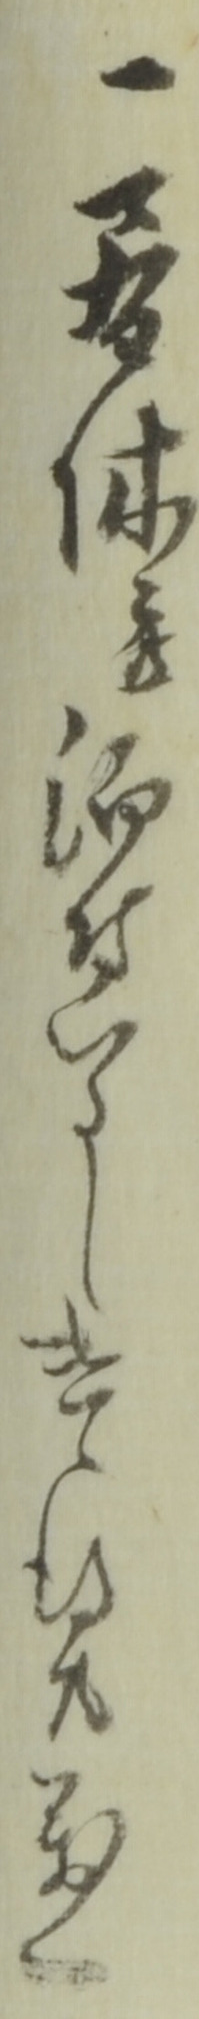一昼休並泊付いたし遣候得共至一

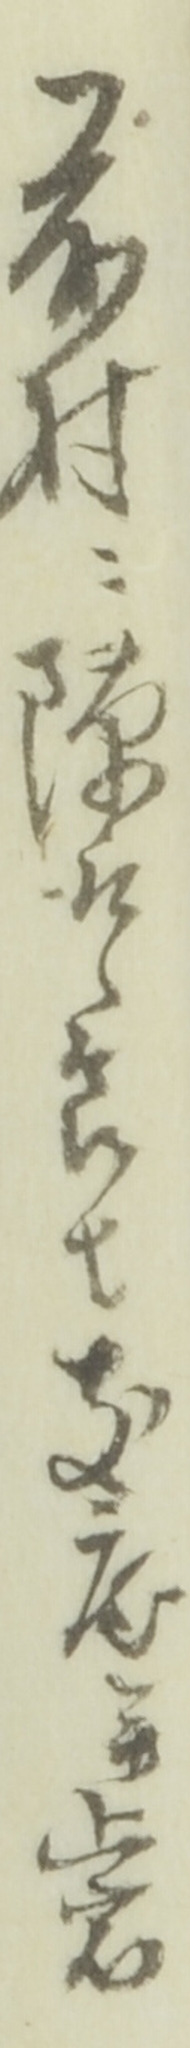ツ前村に餘取候節者仕度並止宿
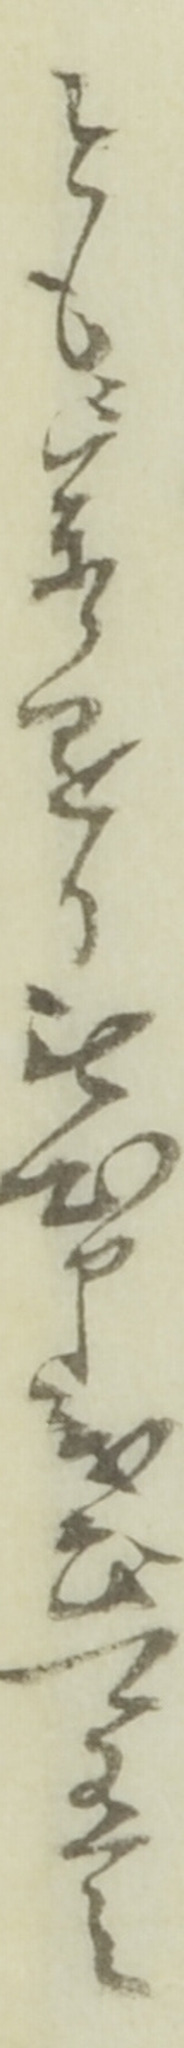とも二承り懸り無出申候義茂可有之
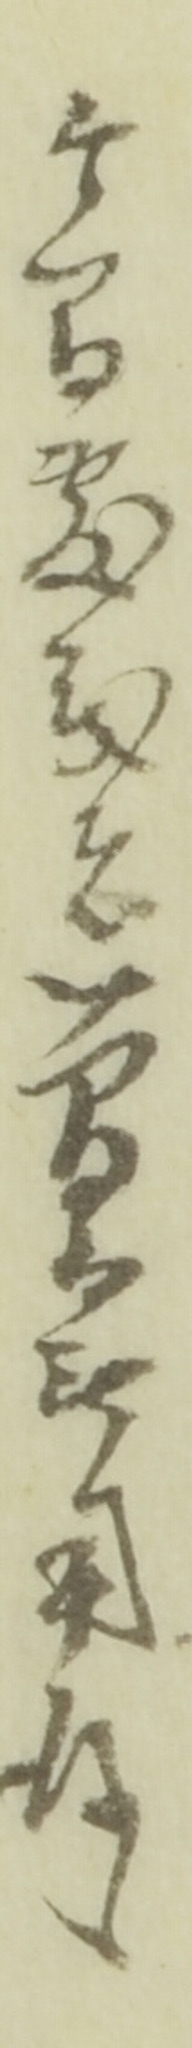重間敷義者兼而無用存候
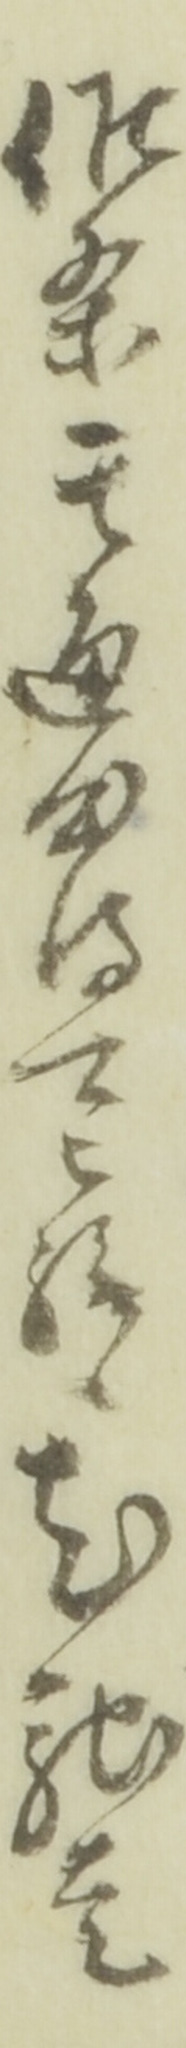候条其通心得可被仰候尤彼是
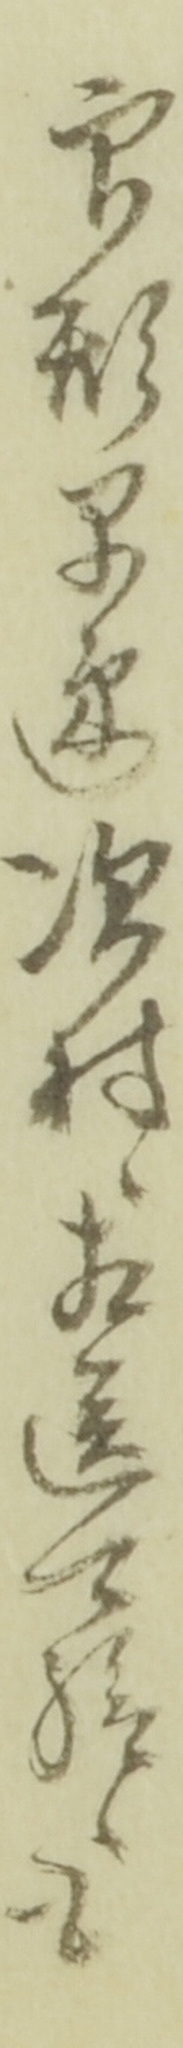印形早速次村二相送可渡候以上
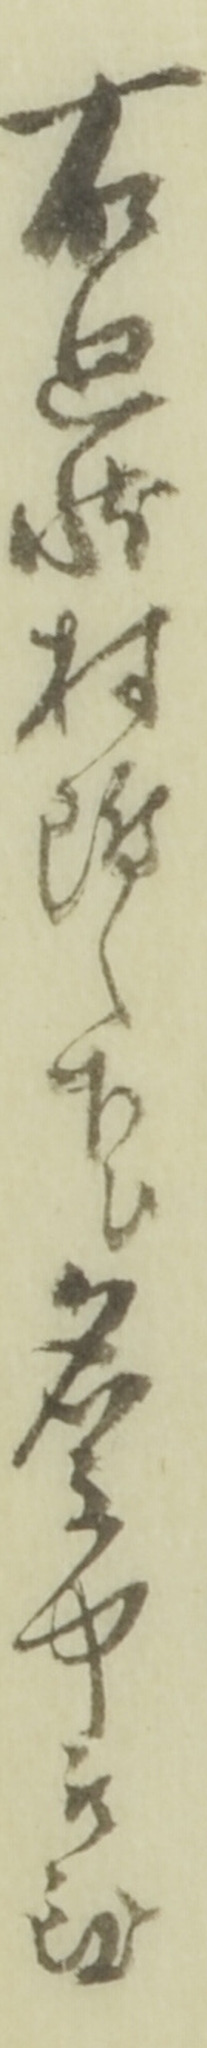右廻状村附候下し名主中被致
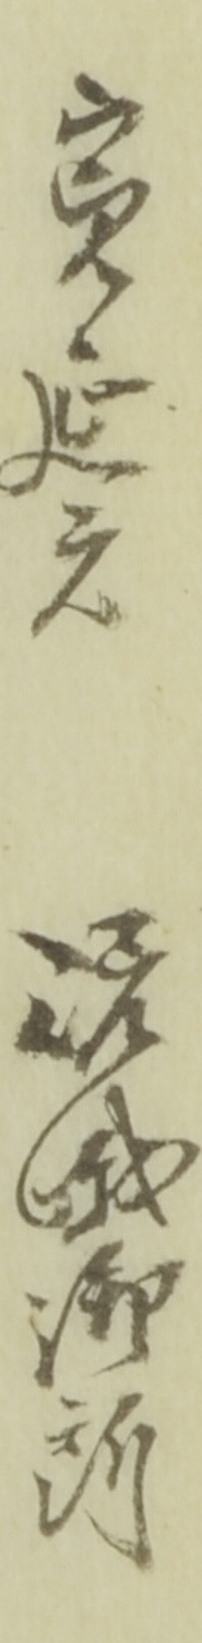寛延元嵯峨御所
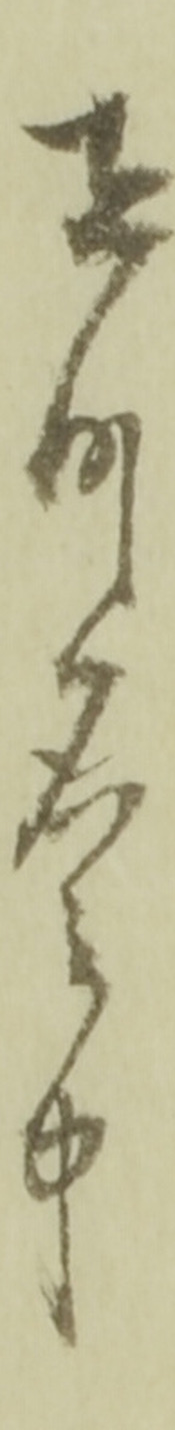在町名主中
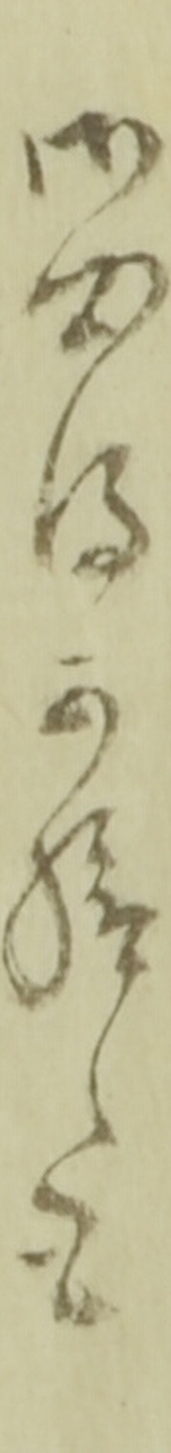御心得可請候以上
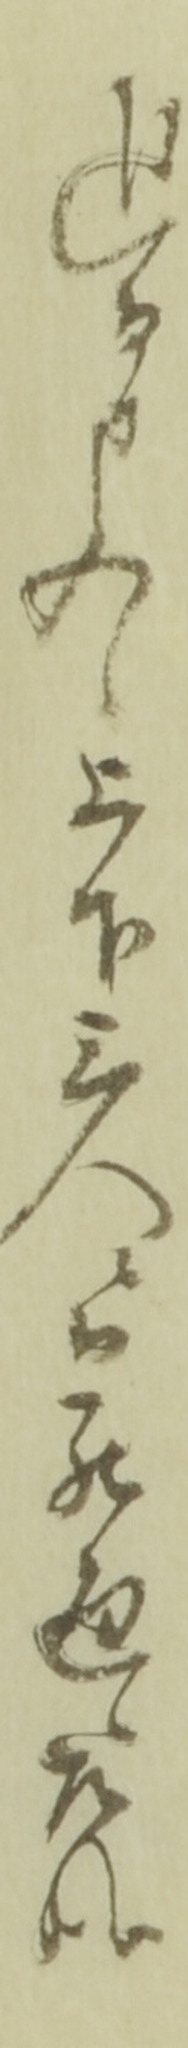追而申入候上下三人二而罷通候左様
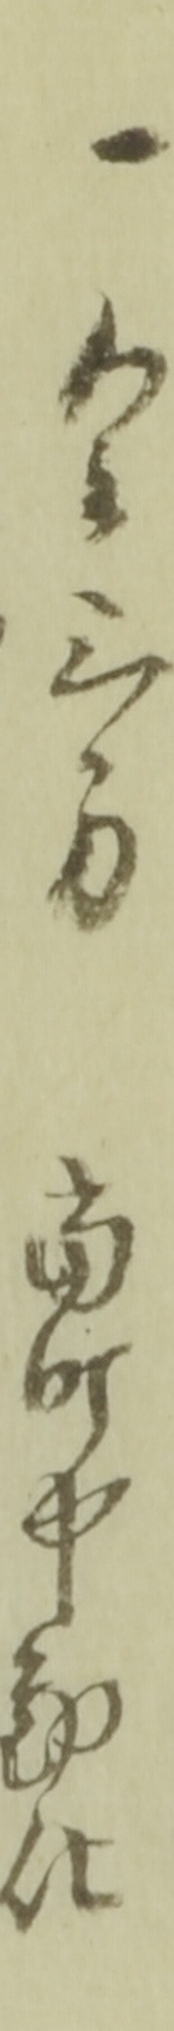一金三両当町中勧化
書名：御公儀様御領主様御触書控
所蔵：伊那市立高遠町図書館・合同会社AMANE
